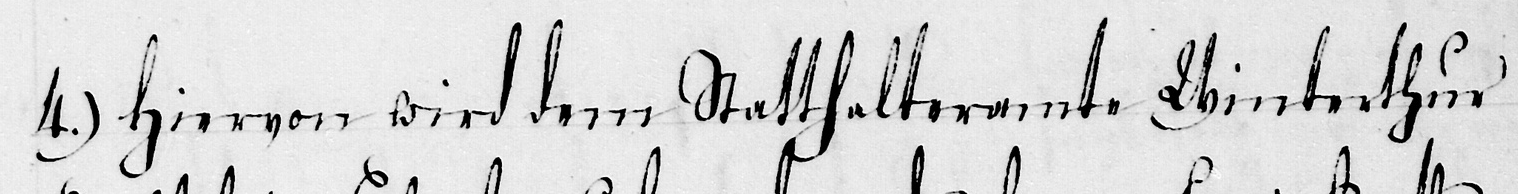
4.) Hiervon wird dem Statthalteramte Winterthur
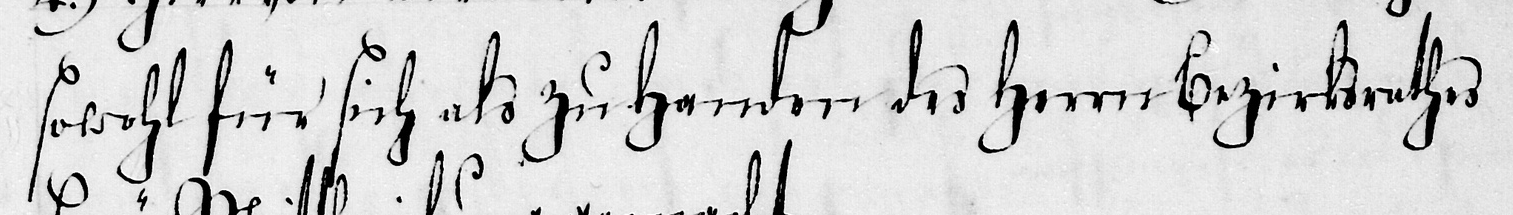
sowohl für sich als zu Handen des Herrn Bezirksrathes
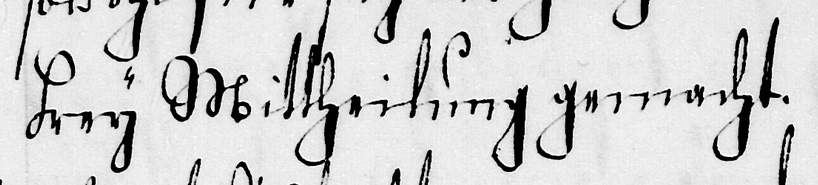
Frey Mittheilung gemacht.
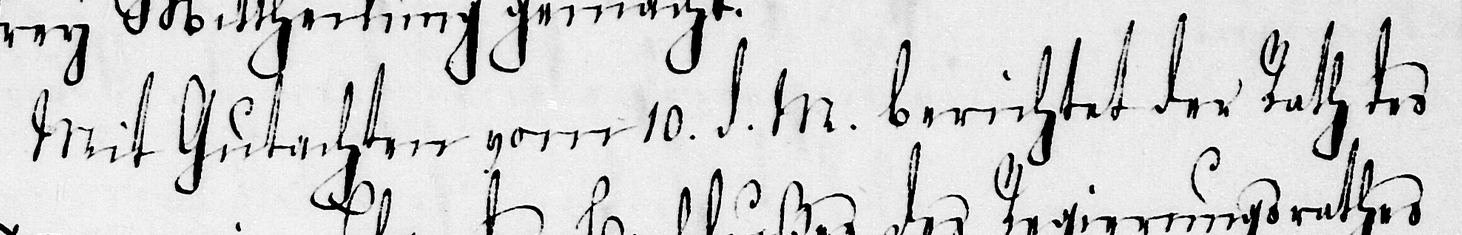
Mit Gutachten vom 10. d. M. berichtet der Rath des
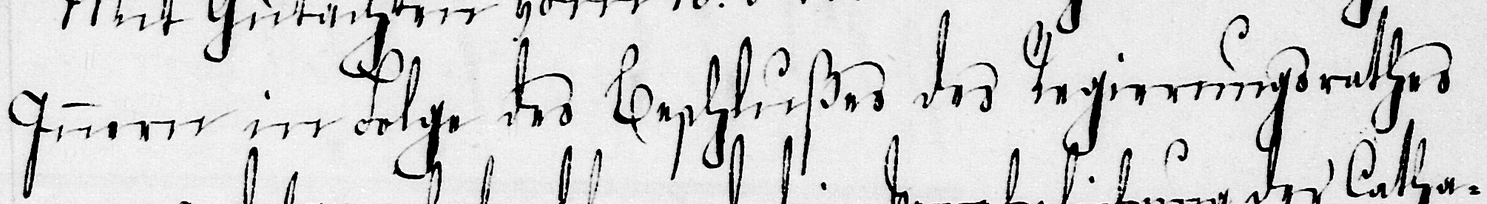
Innern in Folge des Beschlußes des Regierungsrathes
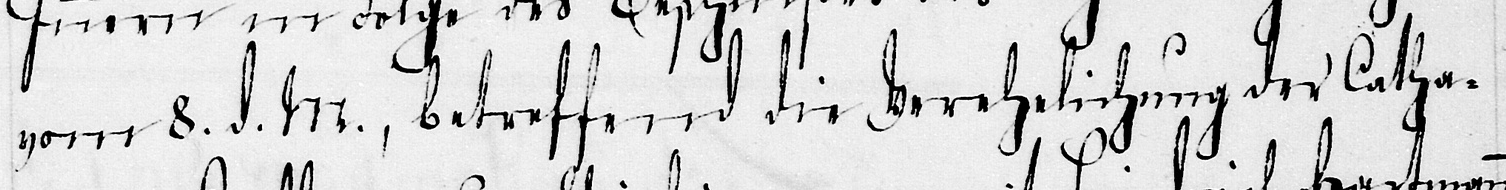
vom 8. d. M., betreffend die Verehelichung der Catha¬
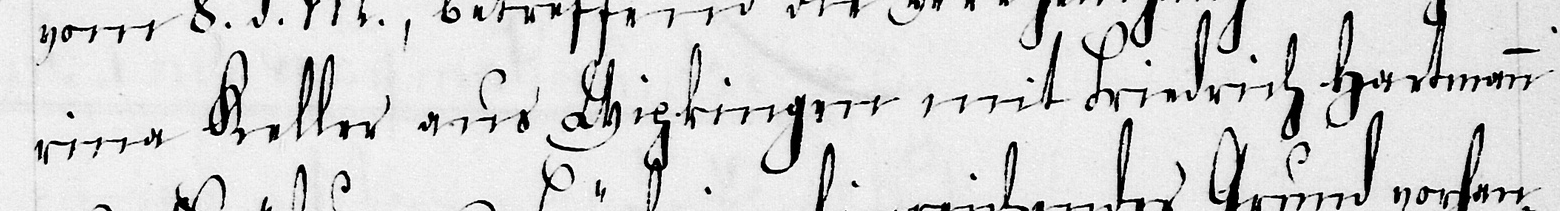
rina Keller aus Wipkingen mit Friedrich Hartmann
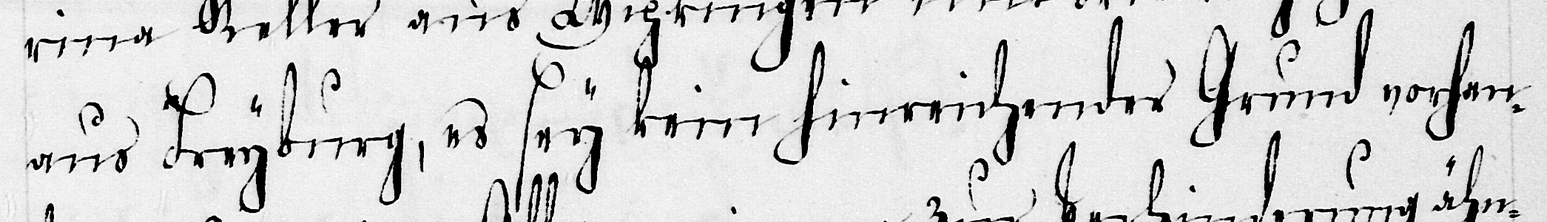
aus Freyburg, es sey kein hinreichender Grund vorhan¬
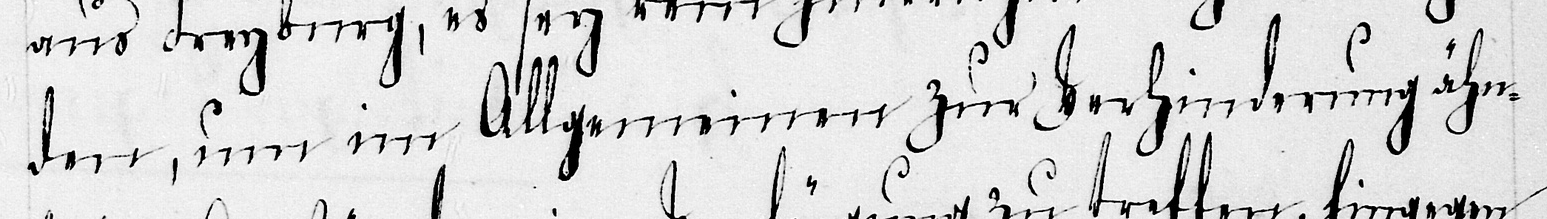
den, um im Allgemeinen zur Verhinderung ähn¬
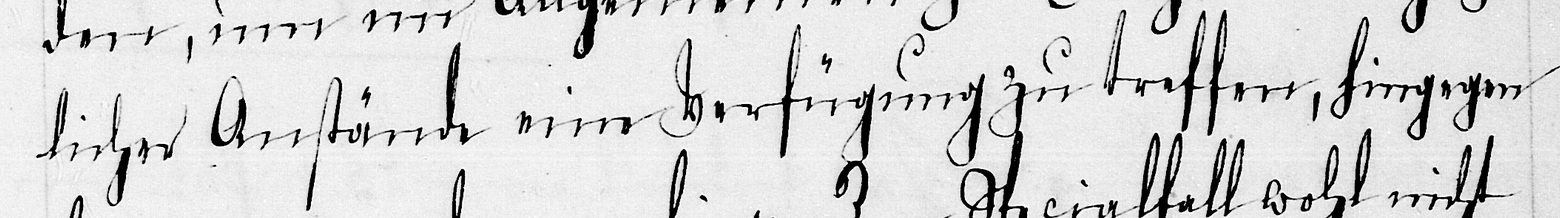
licher Anstände eine Verfügung zu treffen, hingegen
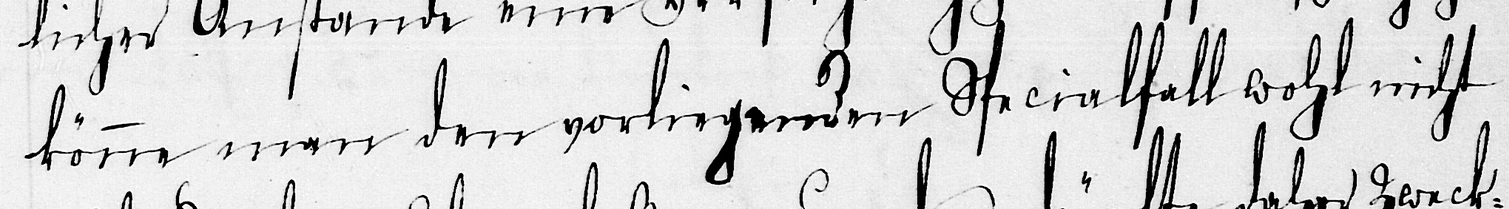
könne man den vorliegenden Specialfall wohl nicht
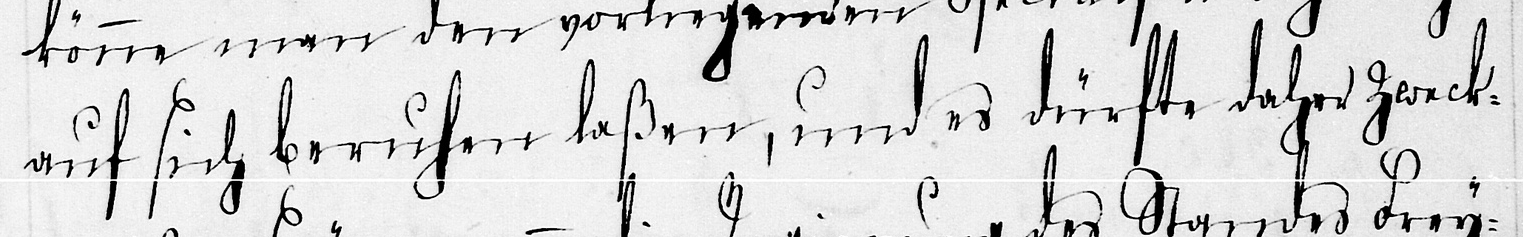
auf sich beruhen laßen, und es dürfte daher zweck¬
